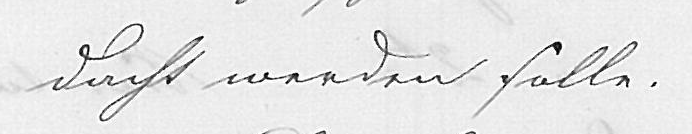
dacht werden solle.
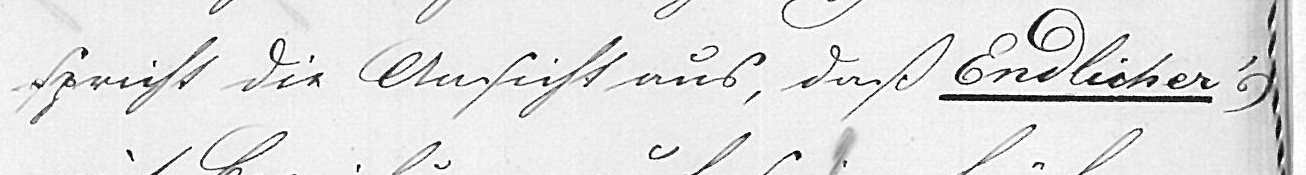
Hr. Regierungsrath Arneth
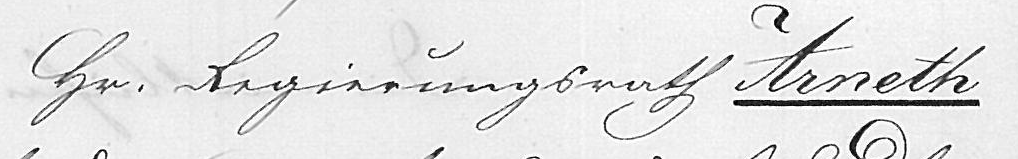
spricht die Ansicht aus, daß Endlicher's
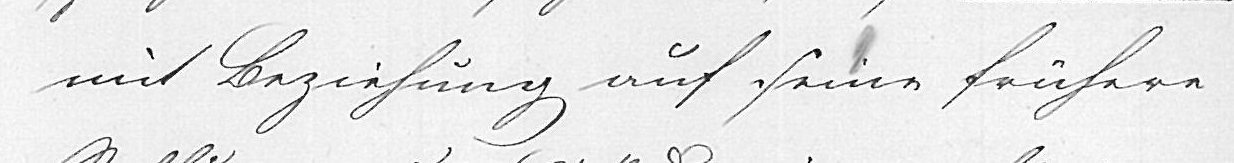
mit Beziehung auf seine frühere
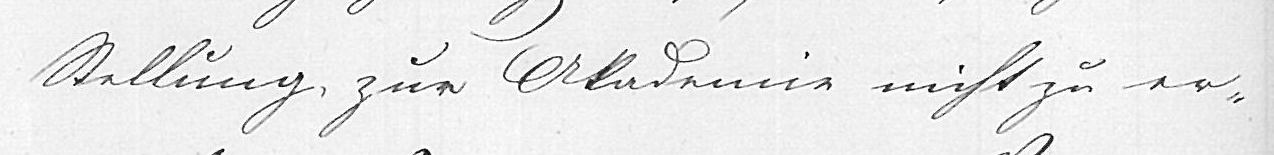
Stellung zur Akademie nicht zu er-
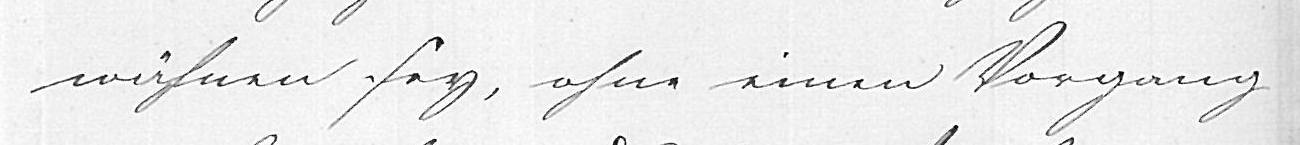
währen sey, ohne einen Vorgang
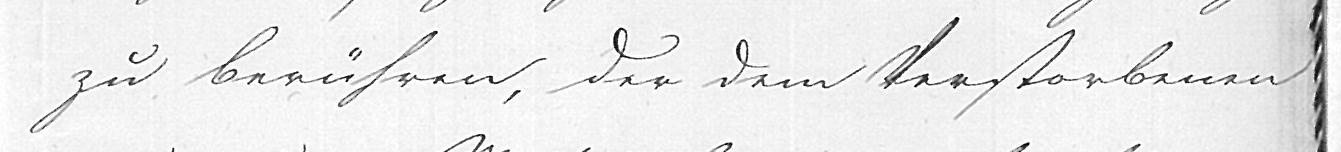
zu berühren, der dem Verstorbeuen
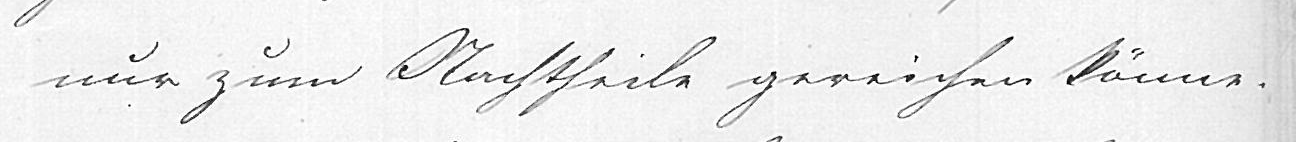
nur zum Nachtheile gereichen könne.
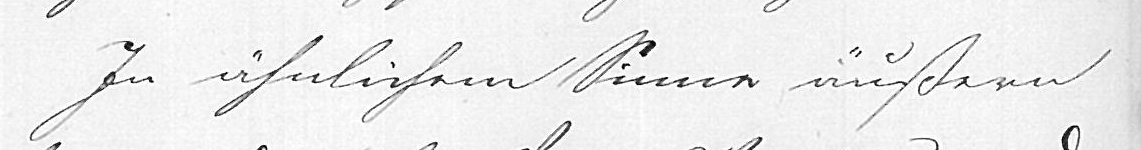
In ähnlichem Sinne äußern
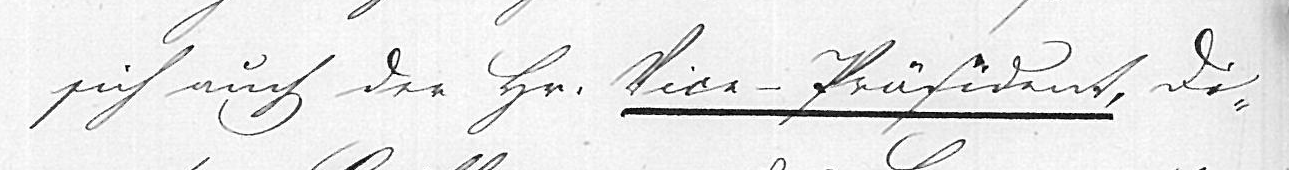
sich noch der Hr. Vice-Präsident, Di-
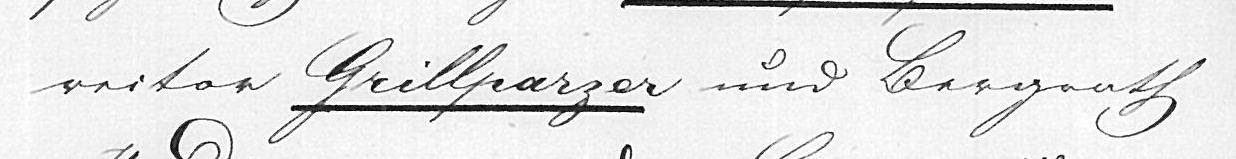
rector Grillparzer und Bergrath
